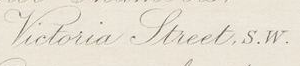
Victoria Street, S.W.
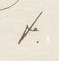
etc.
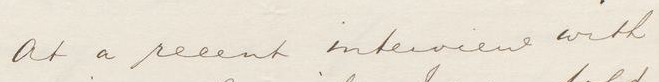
At a recent interview with
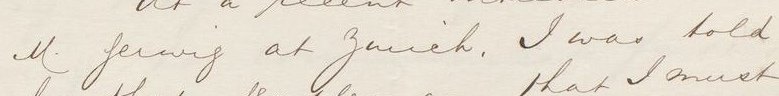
M. Gerwig at Zurich, I was told
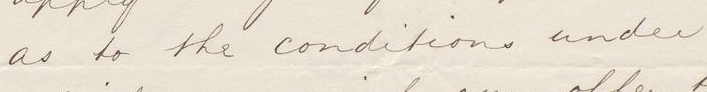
as to the conditions under
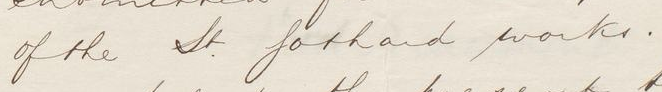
of the St Gothard works. –
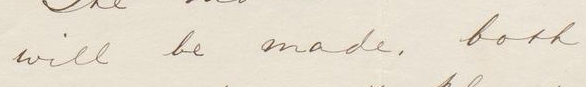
will be made, both
